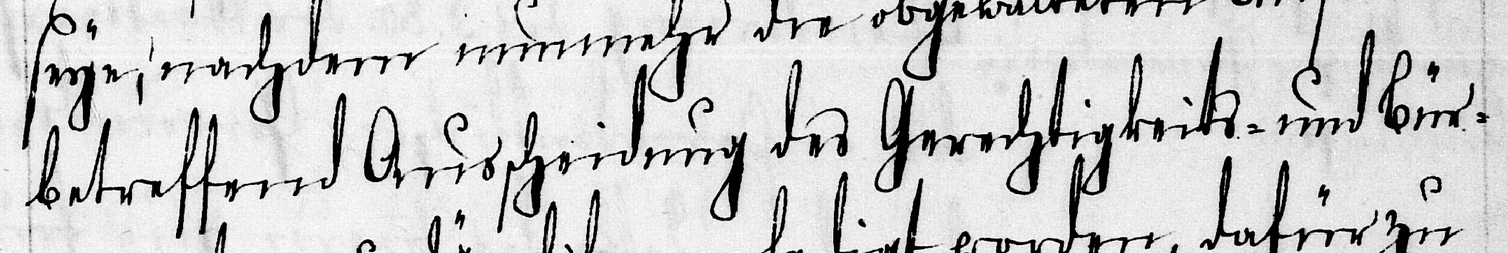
betreffend Ausscheidung des Gerechtigkeits- und Bür¬
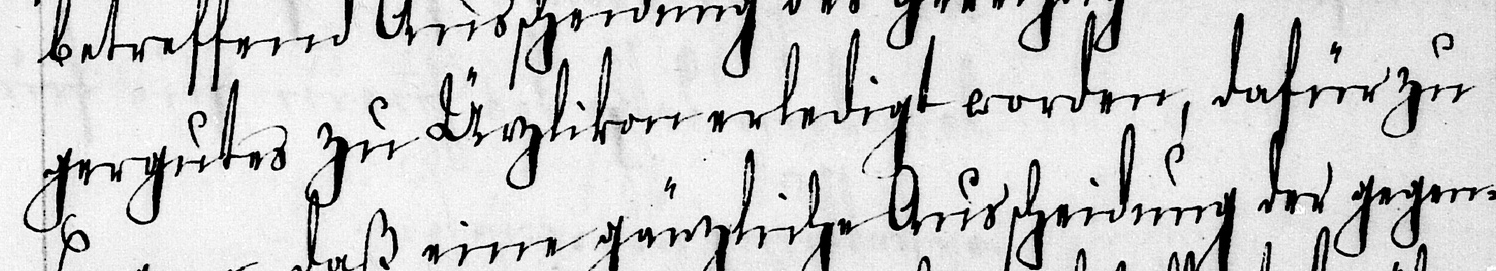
gergutes zu Ürzlikon erledigt worden, dafür zu
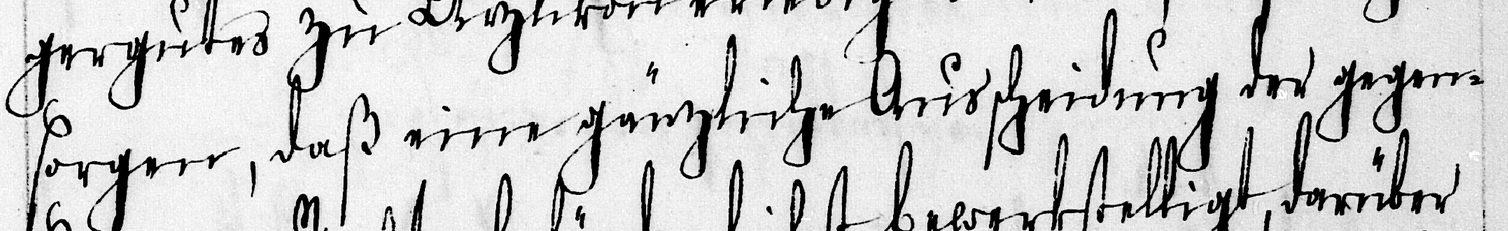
sorgen, daß eine gänzliche Ausscheidung der gegens¬
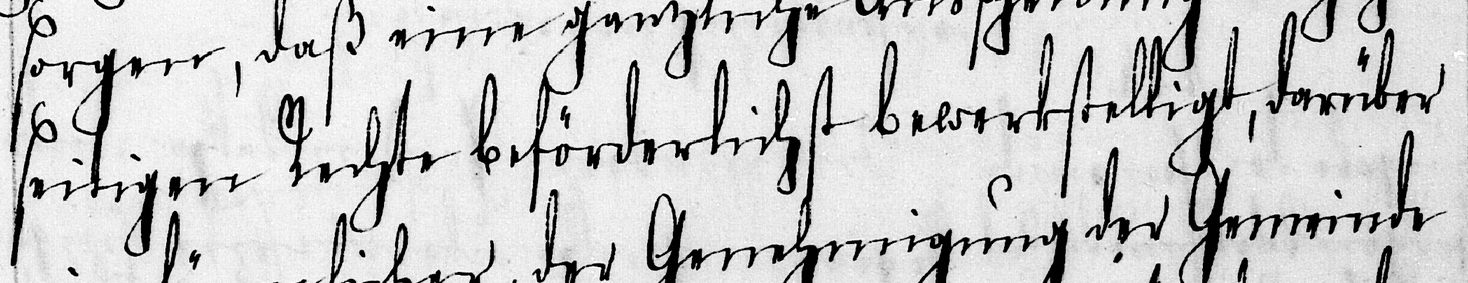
eitigen Rechte beförderlichst bewerkstelligt, darü¬
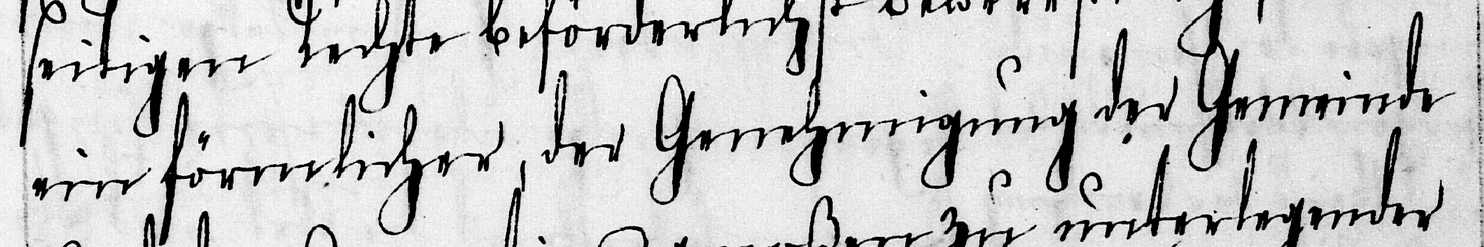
ein förmlicher, der Genehmigung der Gemeinde
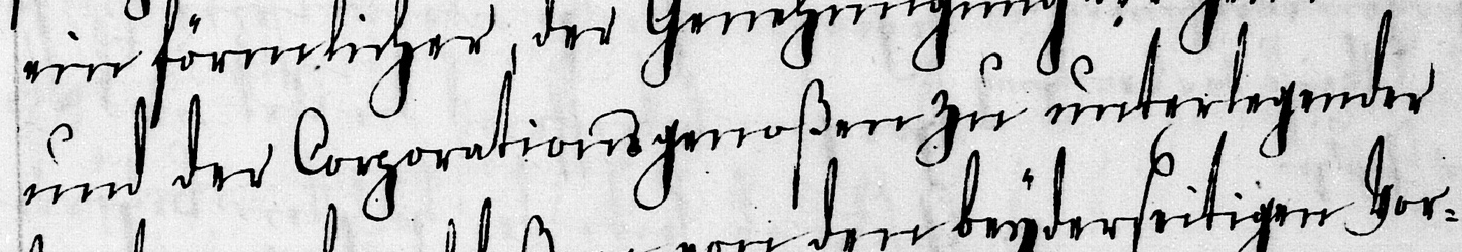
und der Corporationsgenoßen zu unterlegender
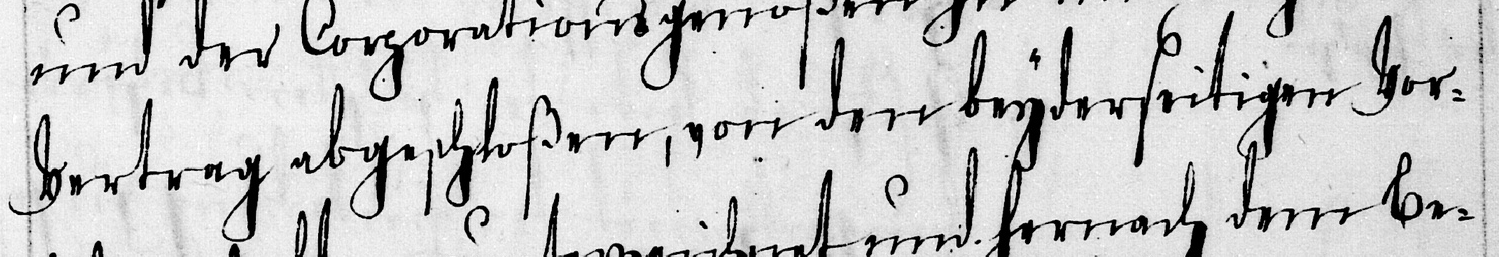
Vertrag abgeschloßen, von den beyderseitigen Vor¬
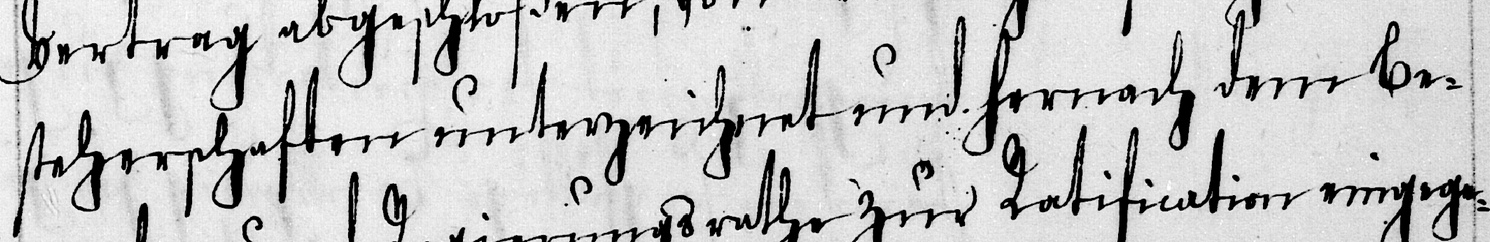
steherschaften unterzeichnet und hernach dem Be¬
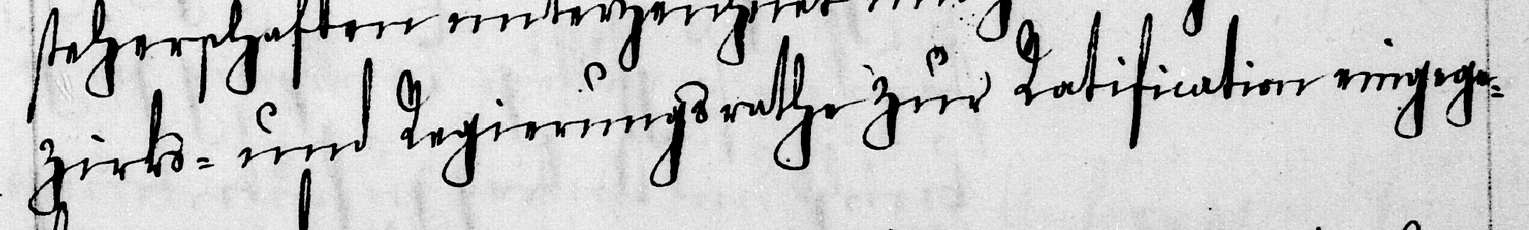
zirks- und Regierungsrathe zur Ratification eingege¬
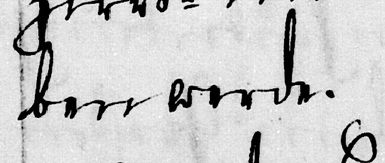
ben werde.
